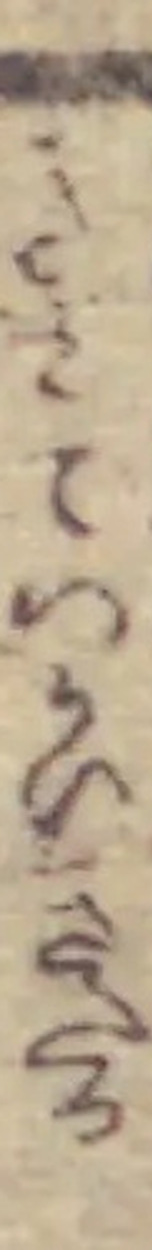きとてつかいきたる
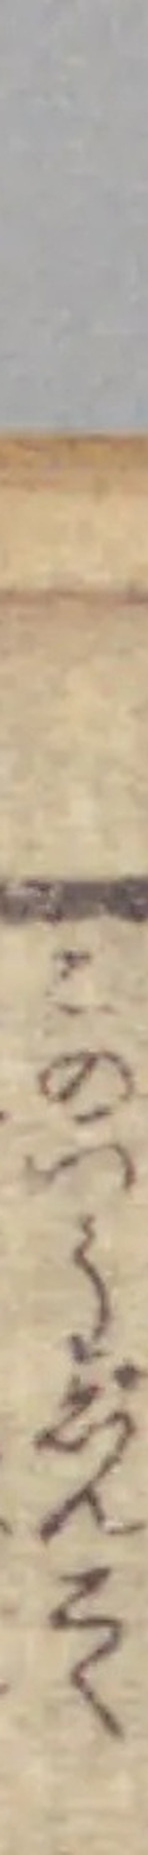このつうじんこく
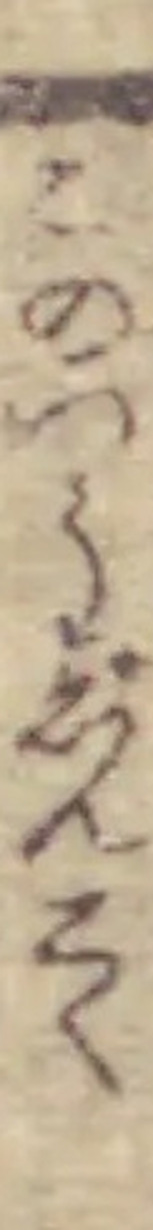このつうじんこく
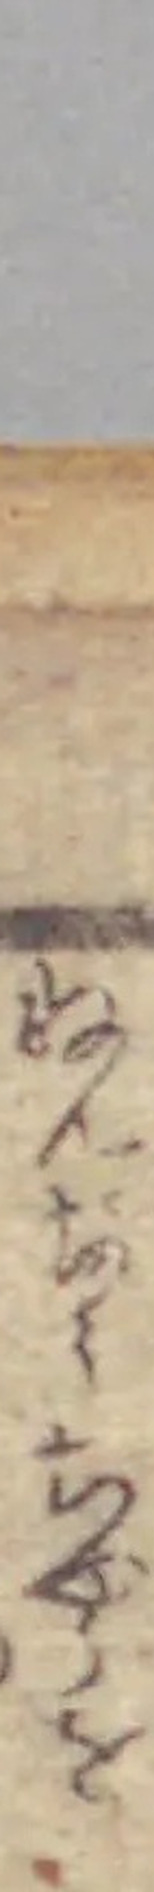ねんちうちやらを
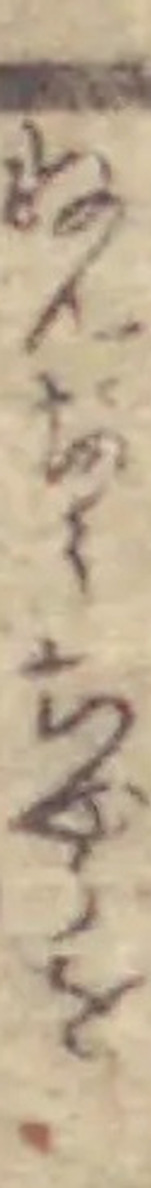ねんちうちやらを
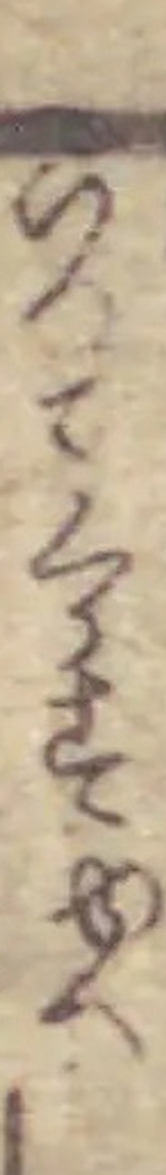いつてくらすゆへ
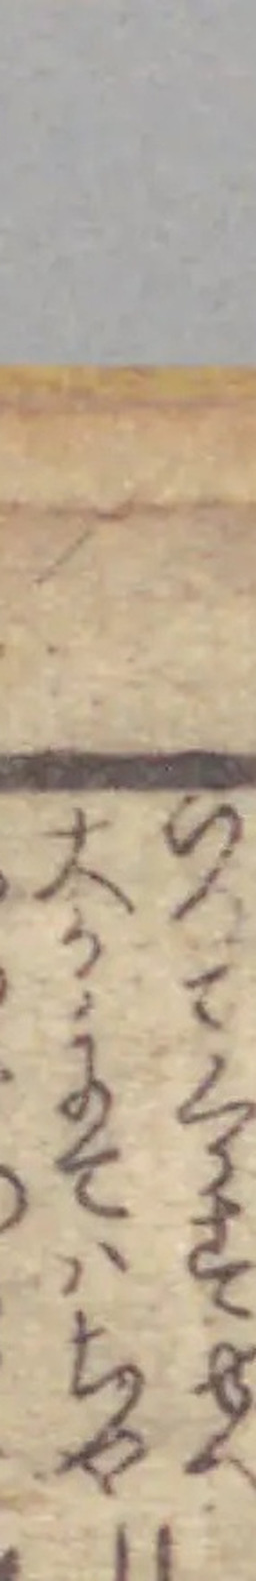大からにてはちや
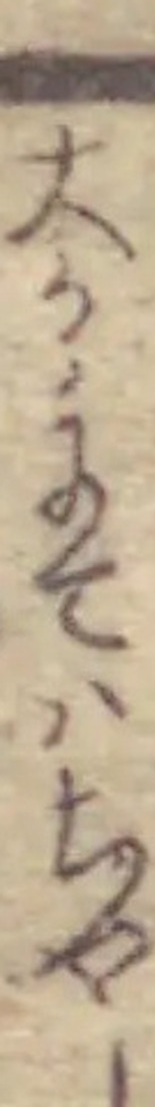大からにてはちや
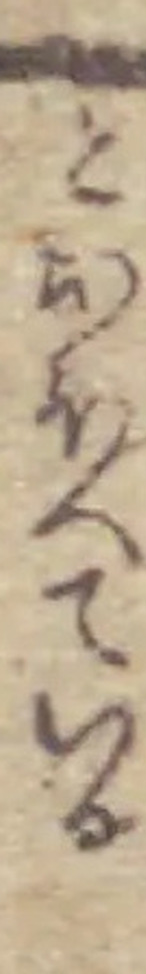とおほえている

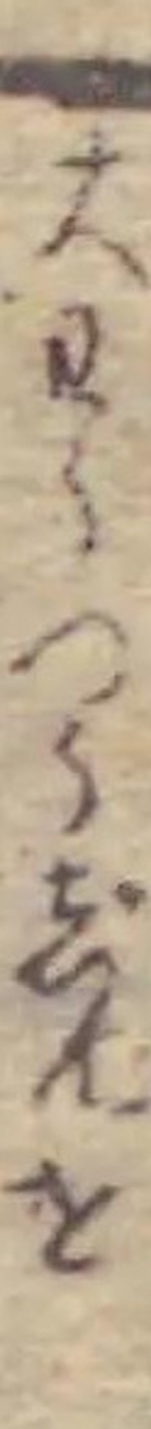大わうつうじんを
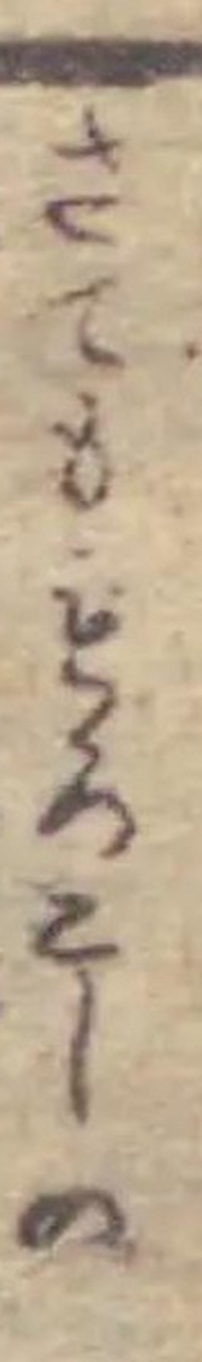さてももろこしの
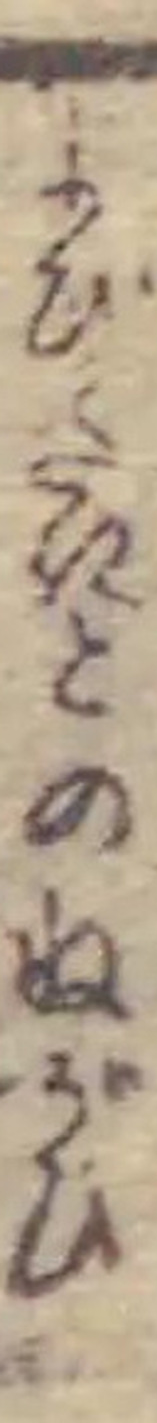よびたきとのねがひ
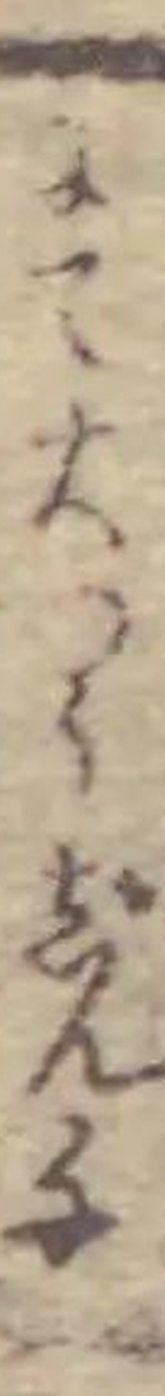にて大つうじん千
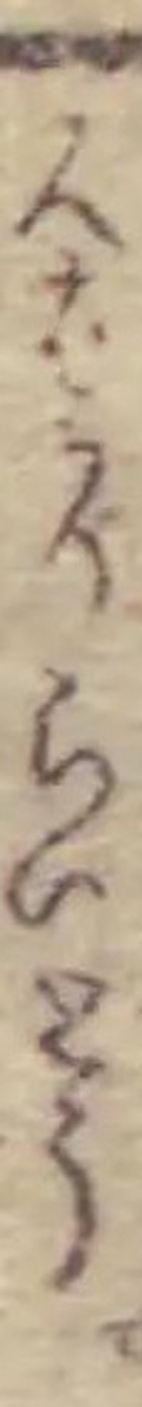人はかりらいとう
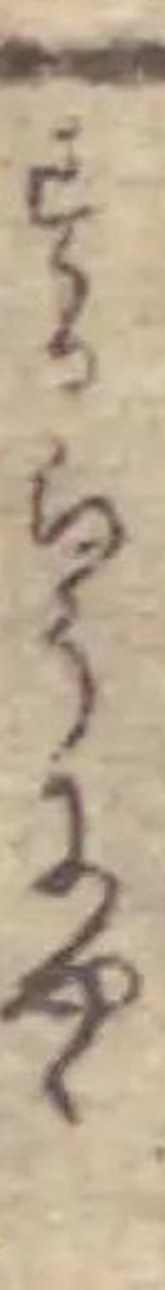するらうにやく
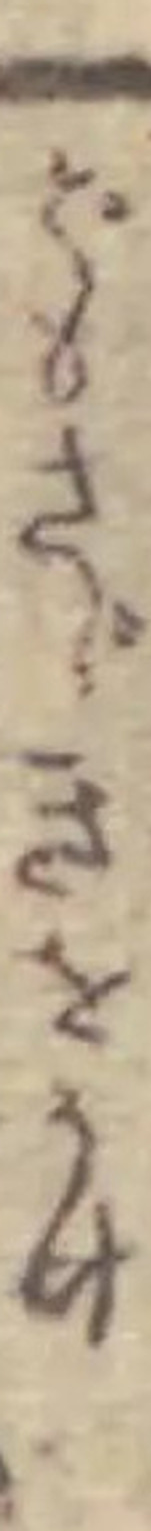どもさじきをかけ
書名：茶羅毛通人 3巻
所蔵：国立国会図書館 National Diet Library, JAPAN
